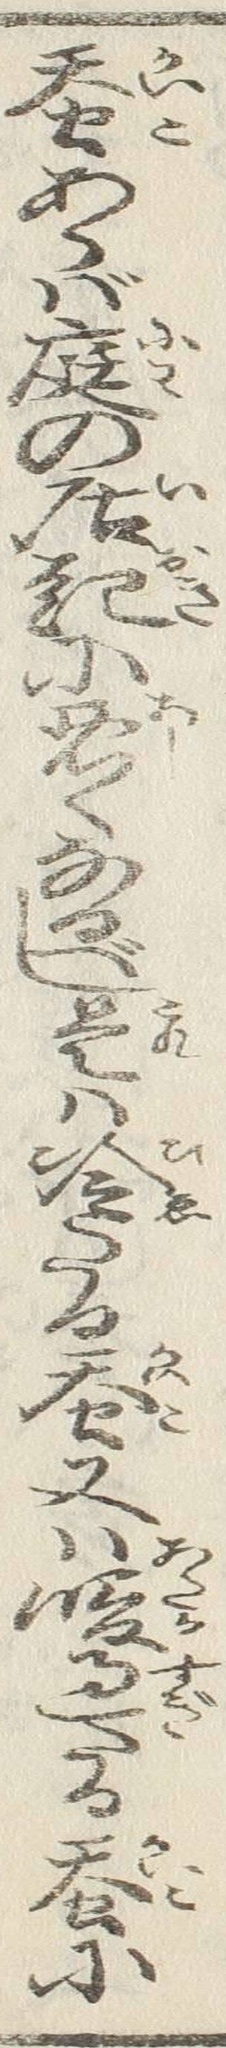蚕あらば庭の居起に悪くなるべし是は冷たる蚕又は暖過たる蚕に
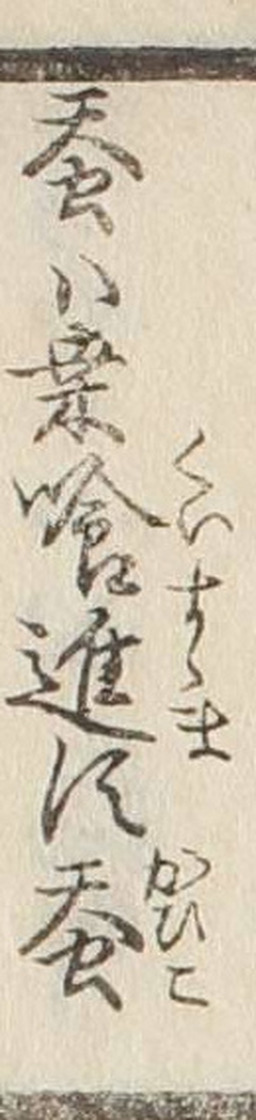蚕は桑喰進す蚕
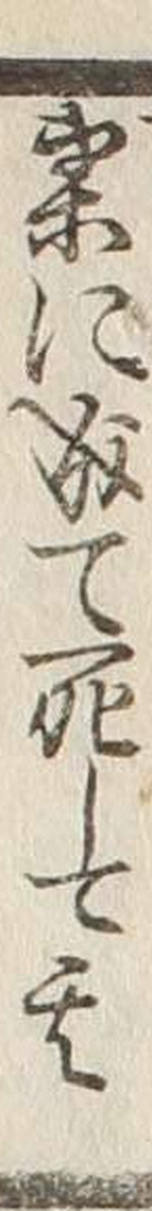柔に成て死して其
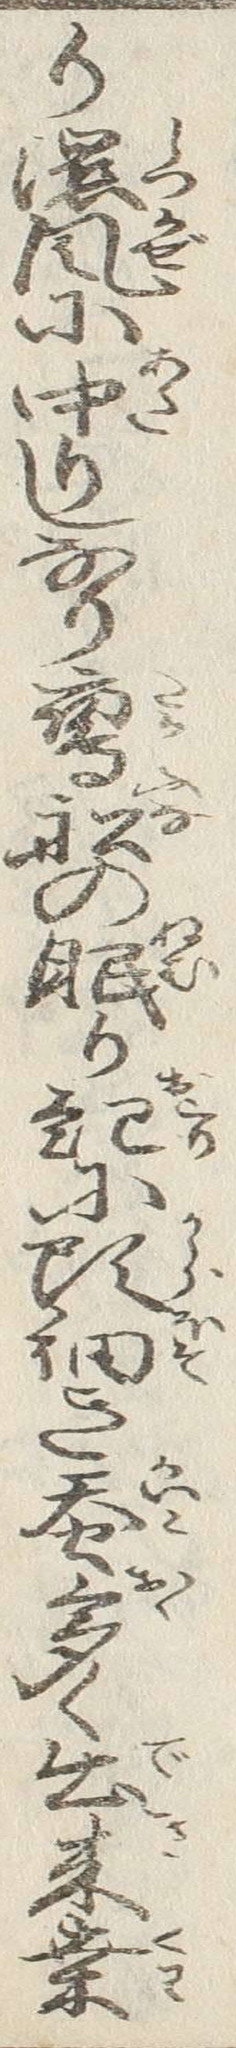り湿風に中りしなり鷹舩の眠り起に頭細き蚕多く出来桑

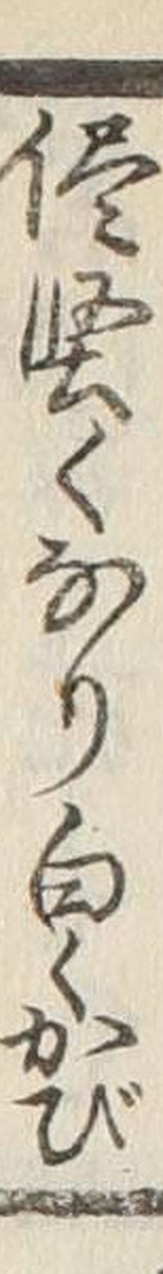侭堅くなり白くかび
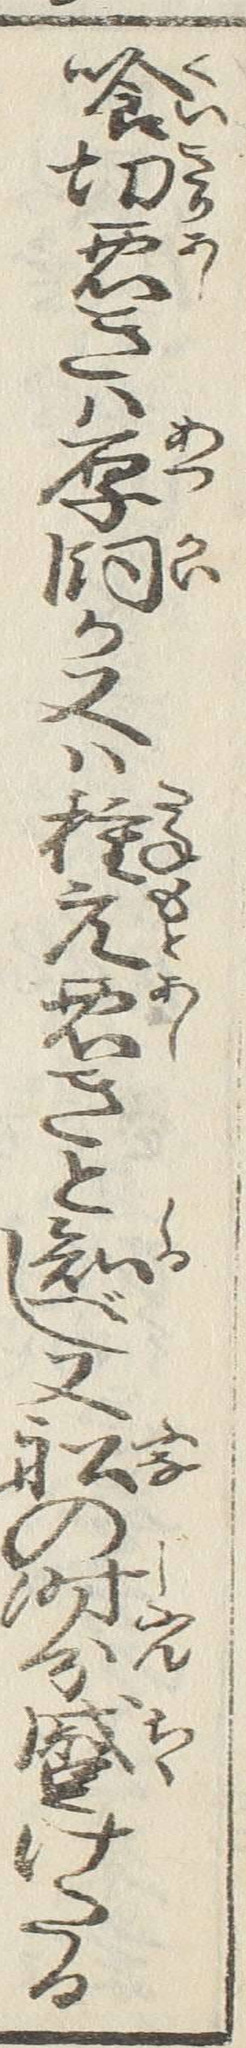喰切悪き厚飼か又は種元悪きと知べし又舩の時分蹙けたる
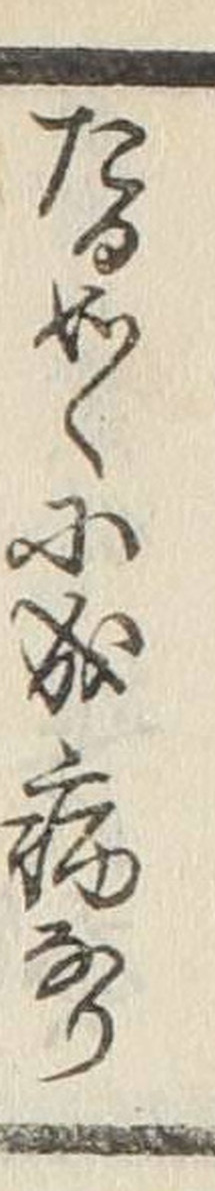たる如くに成病なり
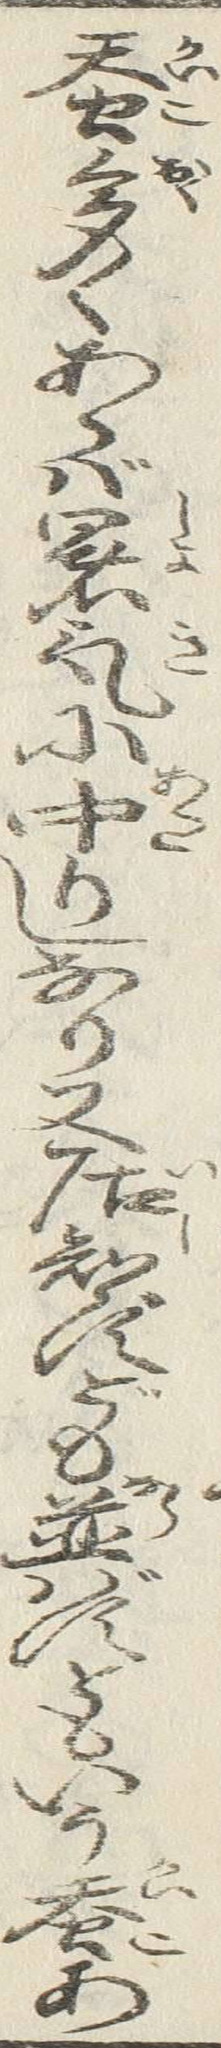蚕多くあらば暑気に中りしなり又居知らずども並ばずともいう蚕あ
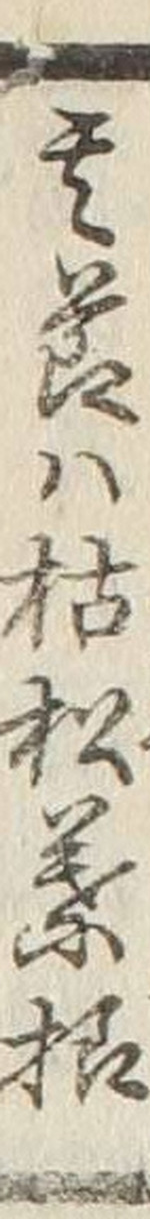其節は枯松葉様
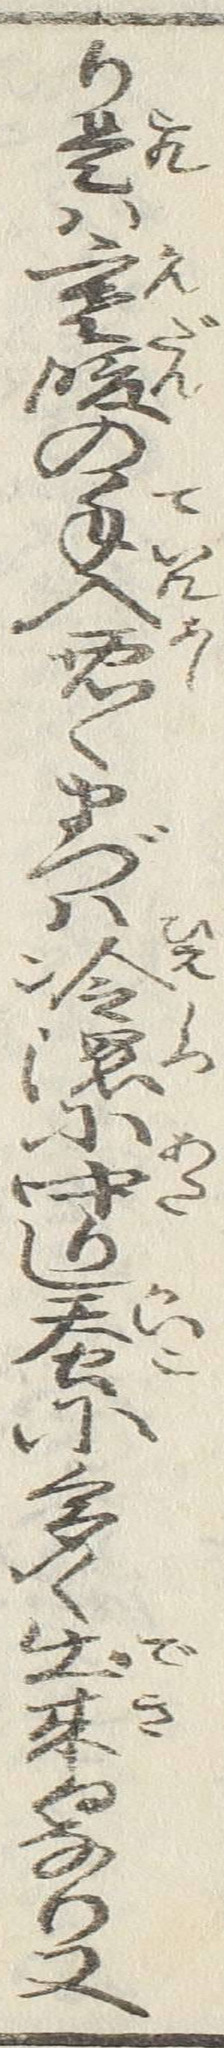り是は寒暖の手入悪くまづは冷湿に中りし蚕に多く出来るなり又
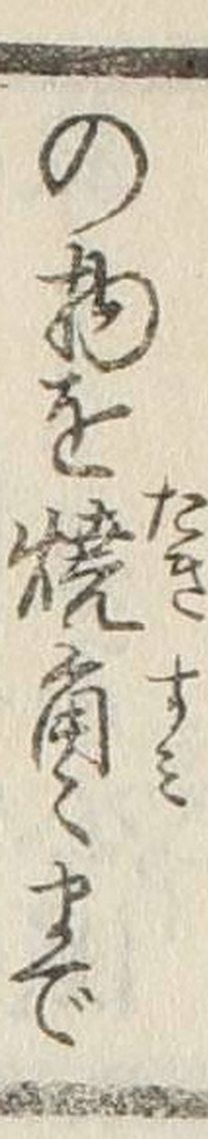の物を焼角々まで
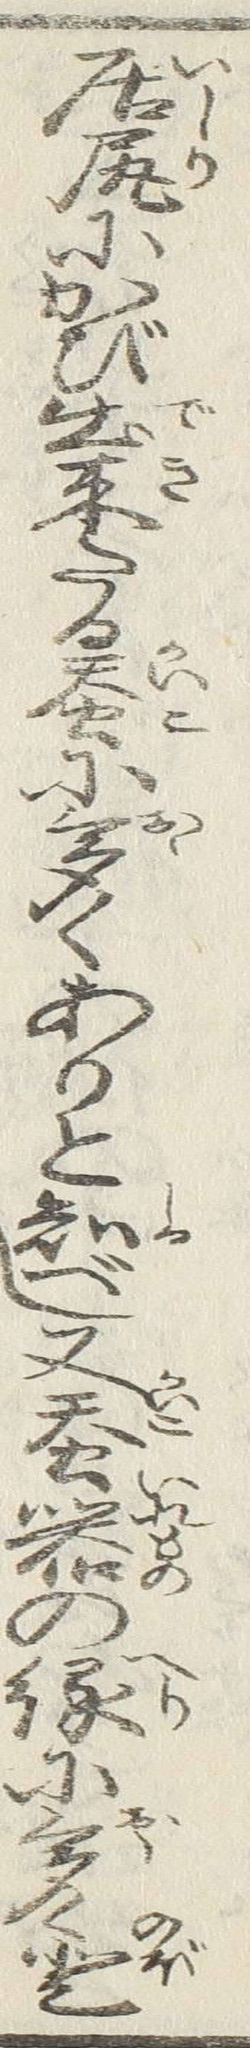居尻にかび出来たる蚕に多くありと知べし又蚕器の縁に多く登
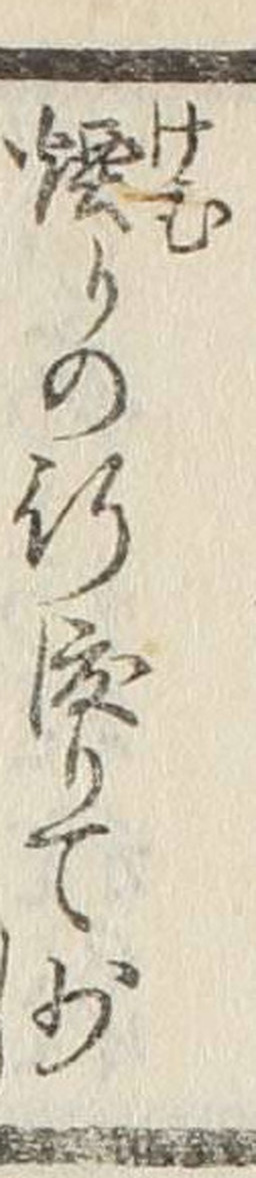煙りの行渡りて少し
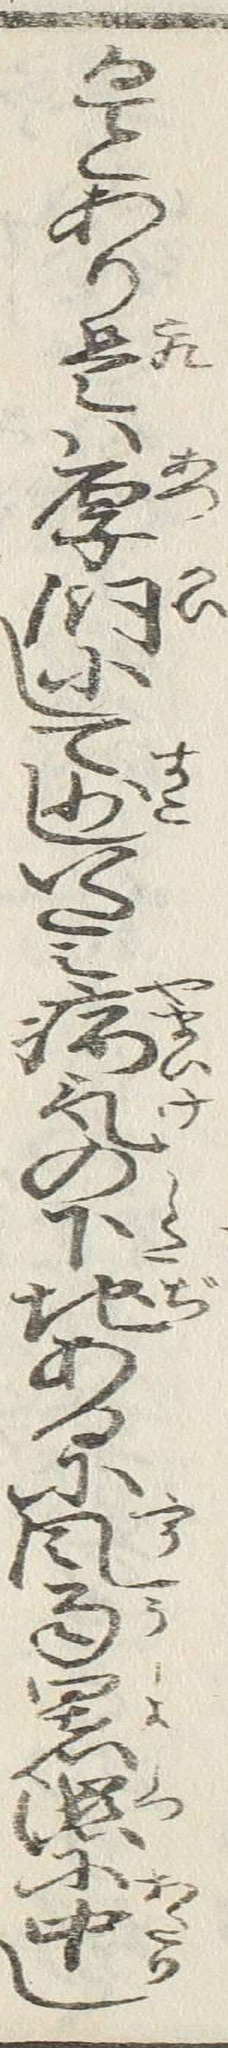ることあり是は厚飼にして少しいたみ病気の下地あるに風雨暑湿に中し
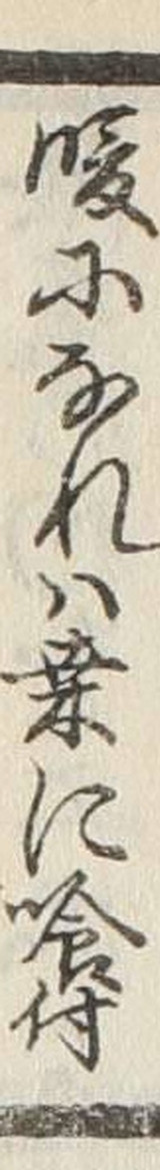暖になれは桑に喰付
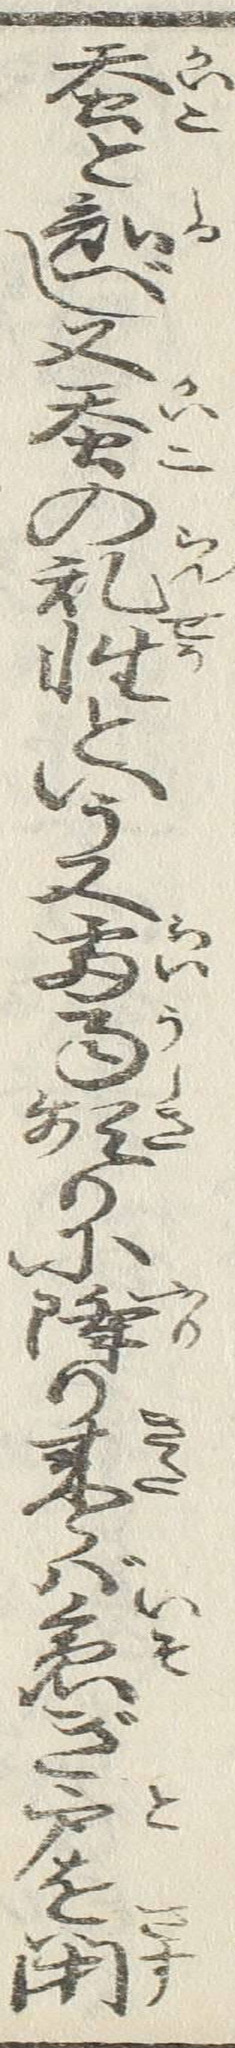蚕と知べし又蚕の乱性という又雷雨頻りに降り来らば急ぎ戸を閉
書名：養蠶實驗録
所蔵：東京大学農学生命科学図書館 国文学研究資料館
